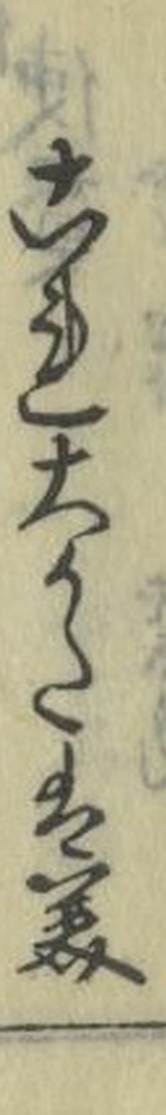これ大かたは美
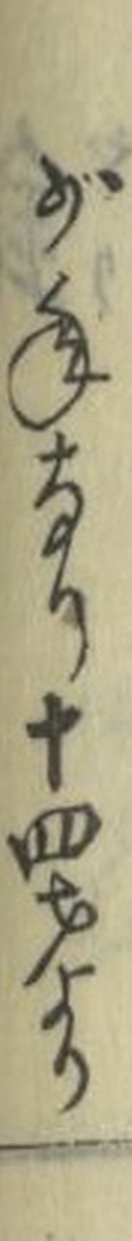少年なり十四才より
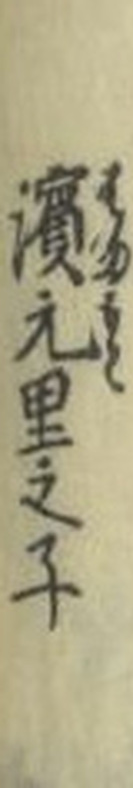登川里之子
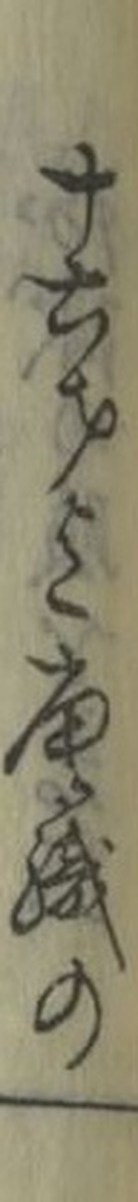十六才は唐織の
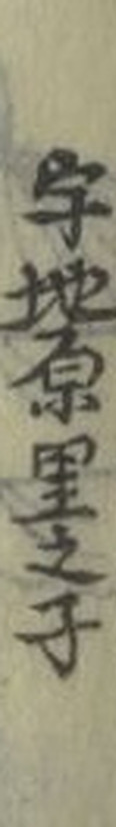宇地原里之子
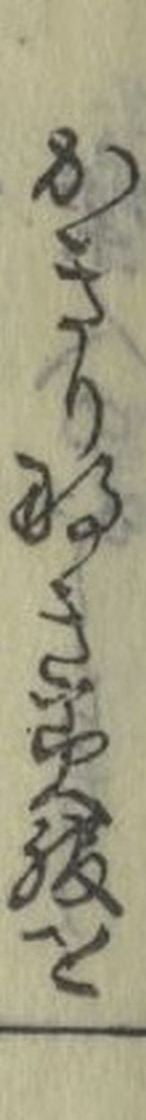かきりなき美服を
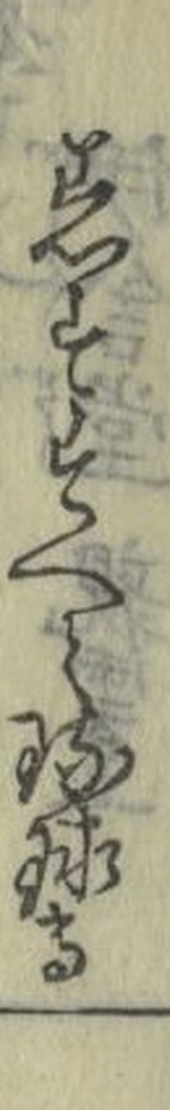着すすへて琉球高
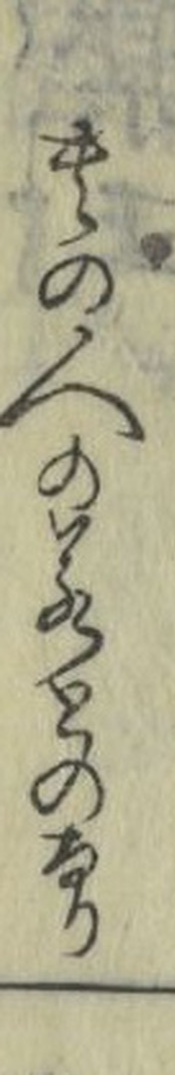貴の人の若とのなり
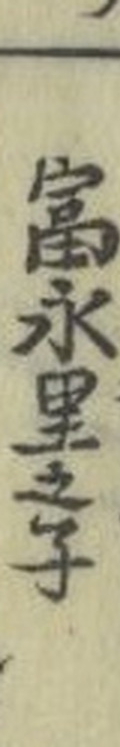富永里之子
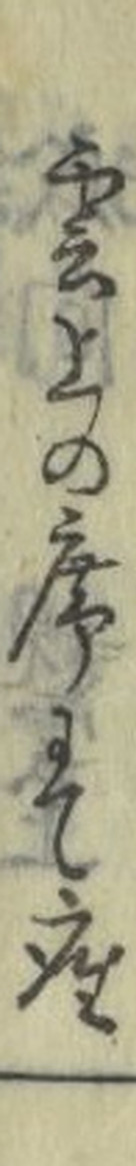雲上の席にて座
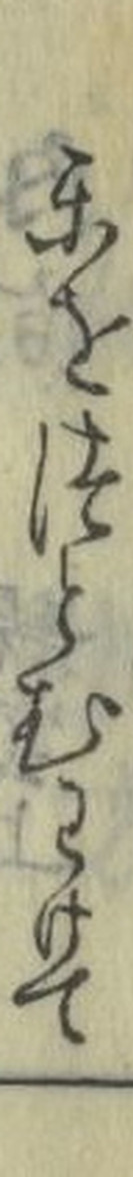楽をつとむわけて
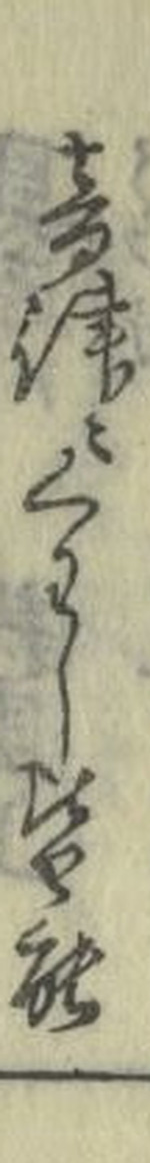音律にくわし皆能
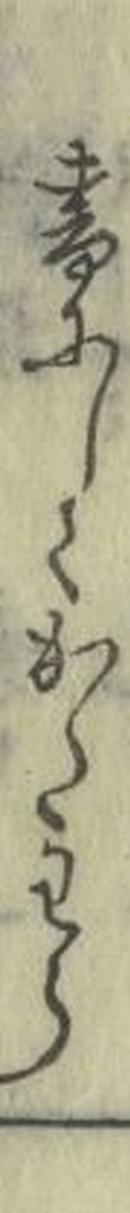書にしてかたわら
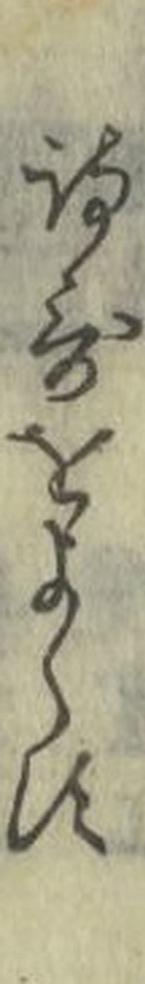詞歌をよらす
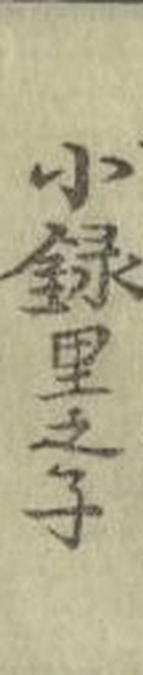小録里之子
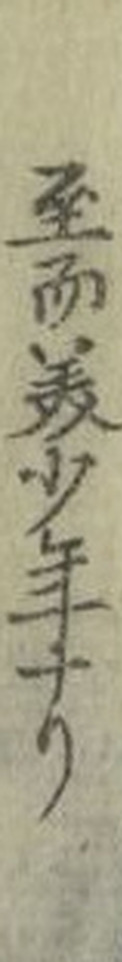至而美少年ナリ
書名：琉球人行列記
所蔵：University of the Ryukyus Library
